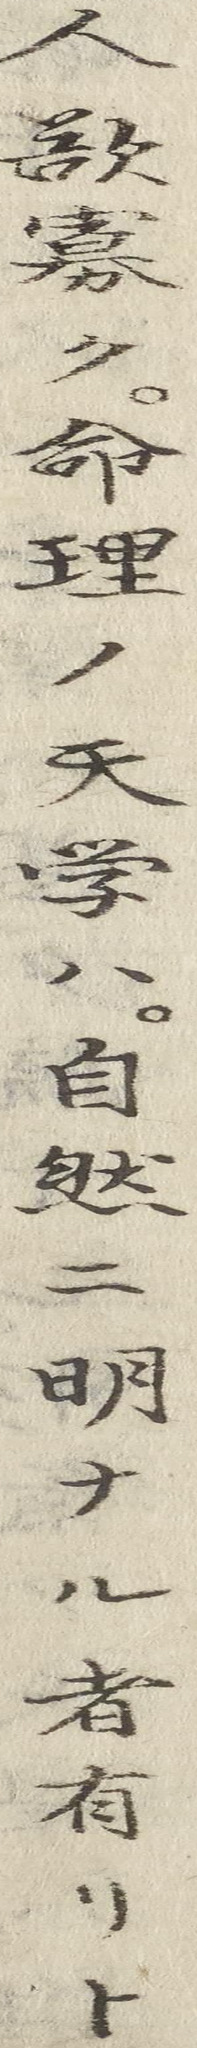人欲寡ク。命理ノ天学ハ。自然ニ明ナル者有リト

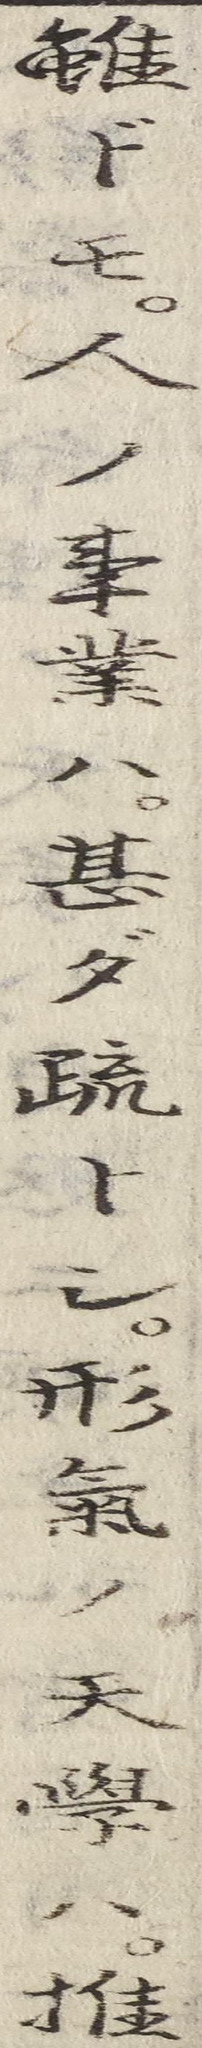雖ドモ。人ノ事業ハ。甚ダ䟽トシ。形気ノ天学ハ。推
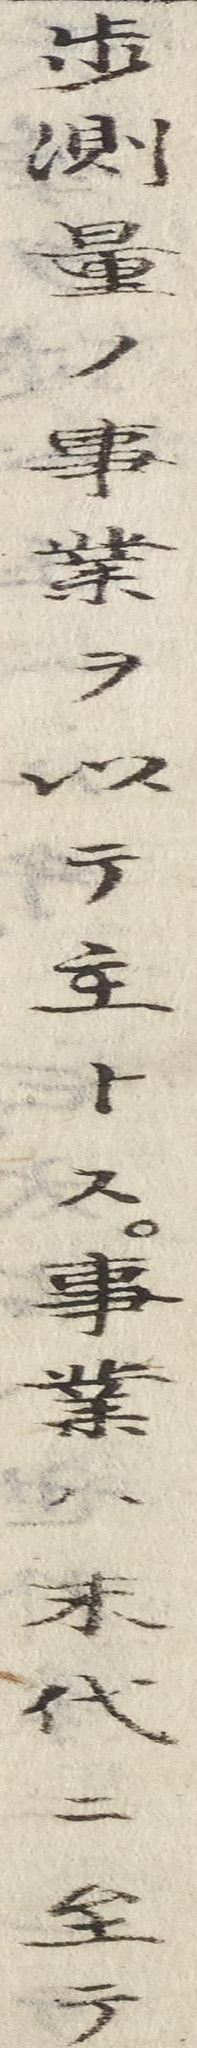歩測量ノ事業ヲ以テ主トス。事業ハ末代ニ至テ
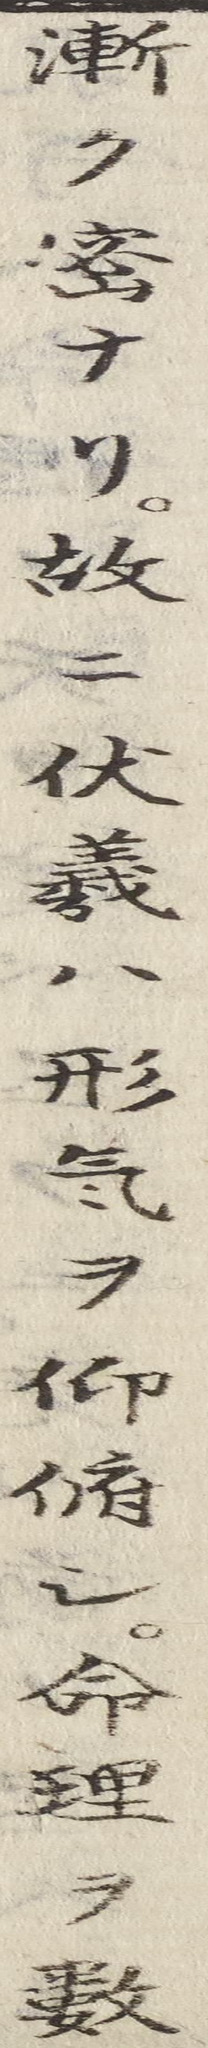漸ク密ナリ。故ニ伏義ハ形気ヲ仰俯シ。命理ヲ数
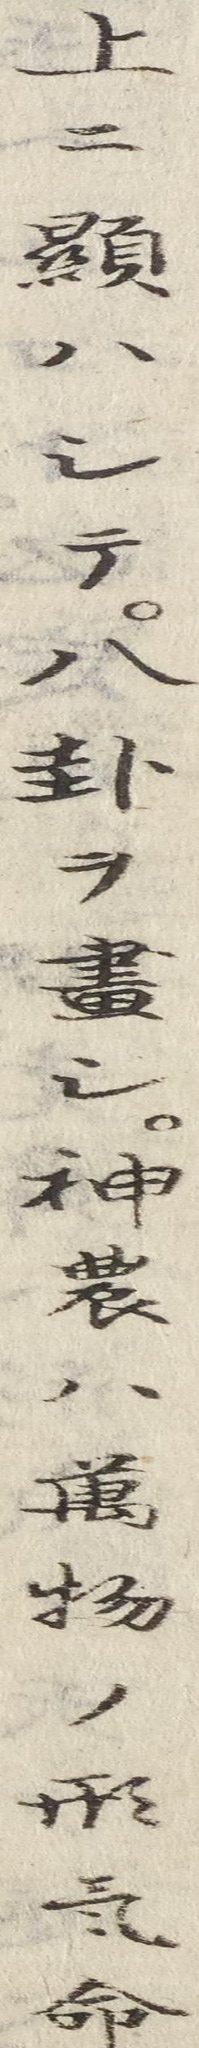上ニ顕ハシテ。八卦ヲ画シ。神農ハ万物ノ形気命
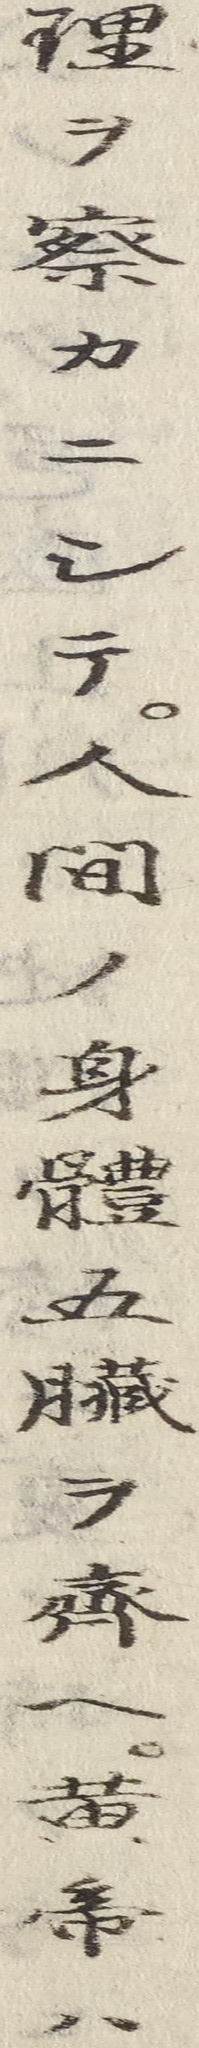理ヲ察カニシテ。人間ノ身体五臓ヲ齊ヘ。黄帝ハ
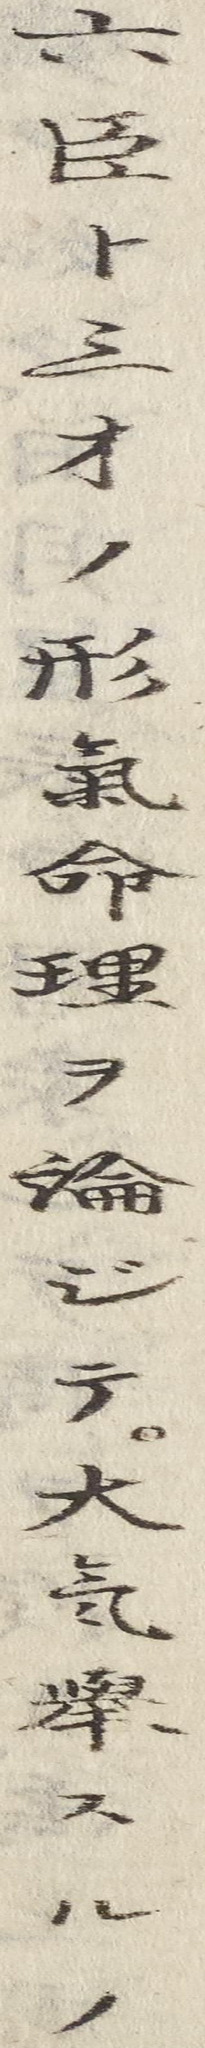六臣ト三才ノ形気命理ヲ論ジテ。大気挙スルノ
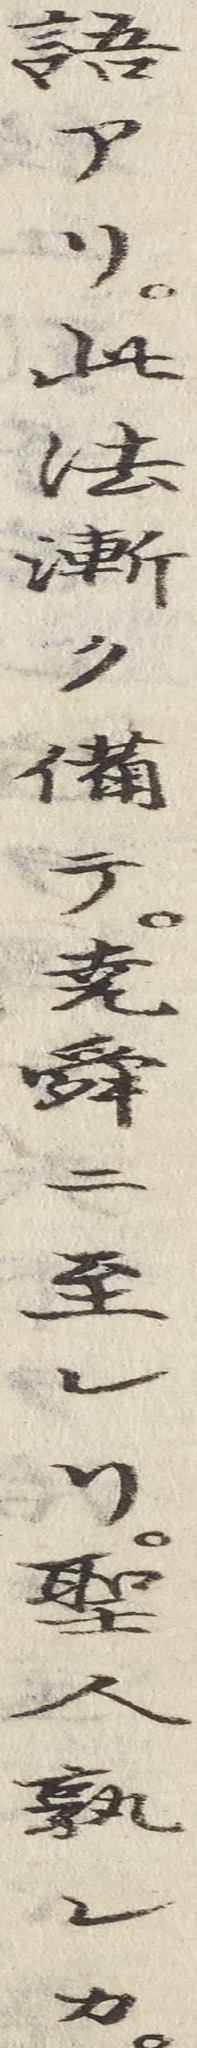語アリ。此法漸ク備テ。尭舜ニ至レリ。聖人孰レカ。
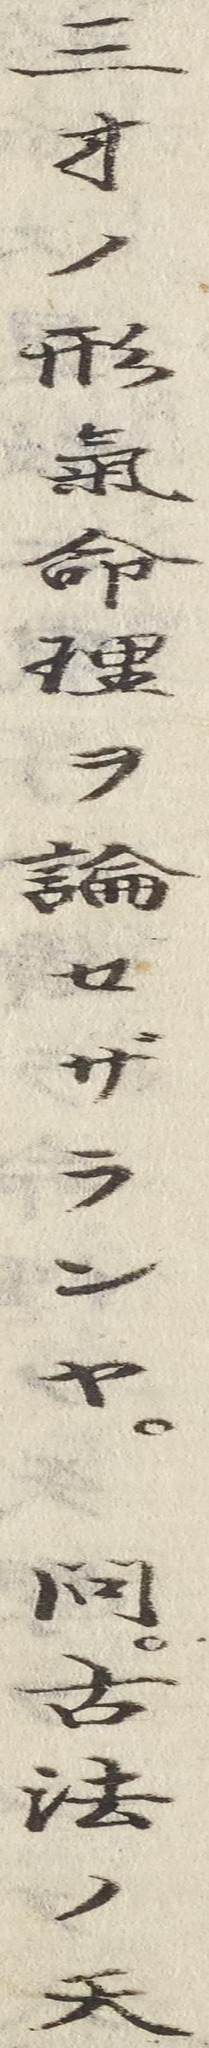三才ノ形気命理ヲ論セザランヤ。問。古法ノ天
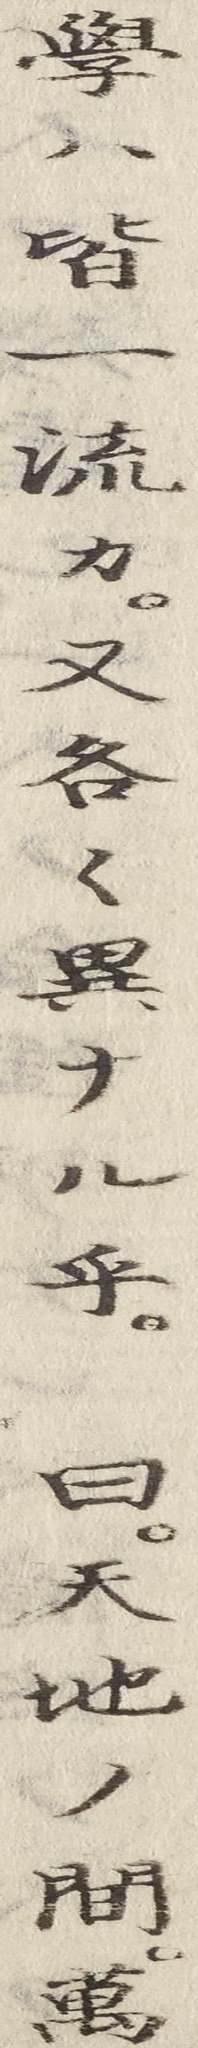学ハ皆一流カ。又各々異ナル乎。曰。天地ノ間。萬
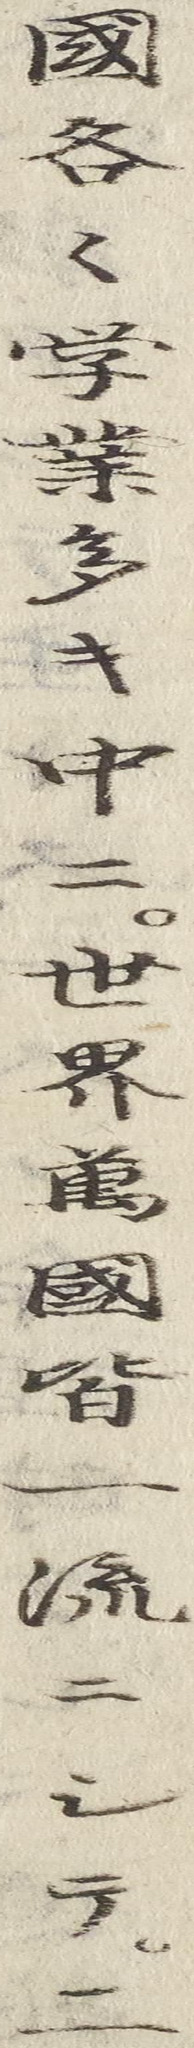国各々学業多キ中ニ。世界万国皆一流にして。二
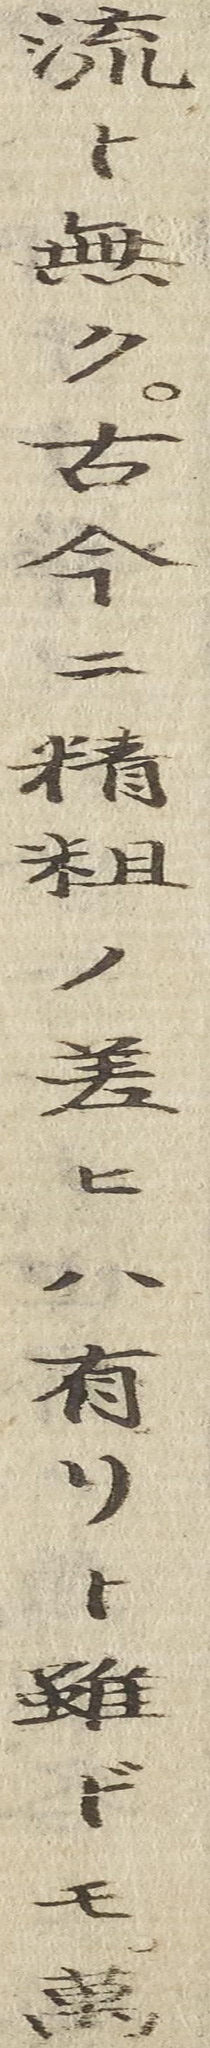流ト無ク。古今ニ精粗ノ差ヒハ有リト雖ドモ。萬
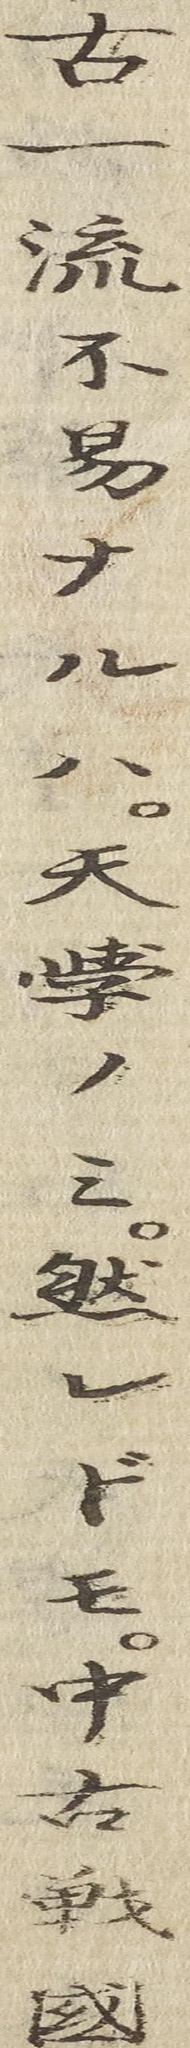古一流不易ナルハ。天学ノミ。然レドモ。中古戦国
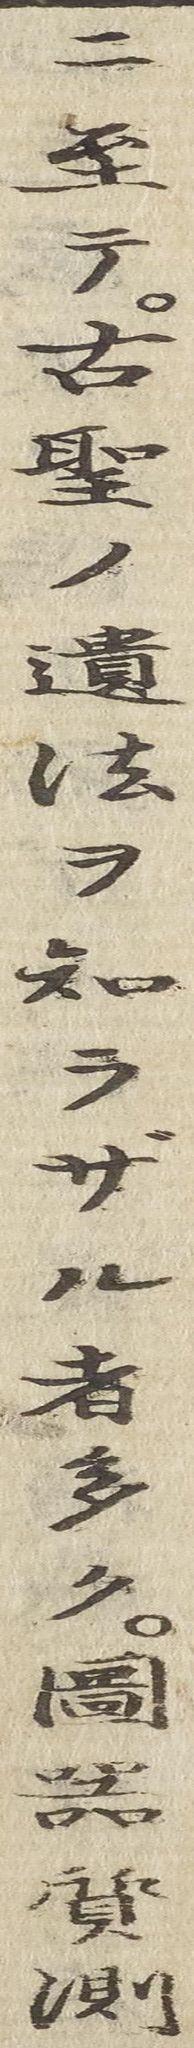ニ至テ。古聖ノ遺法ヲ知ラザル者多ク。図器質測
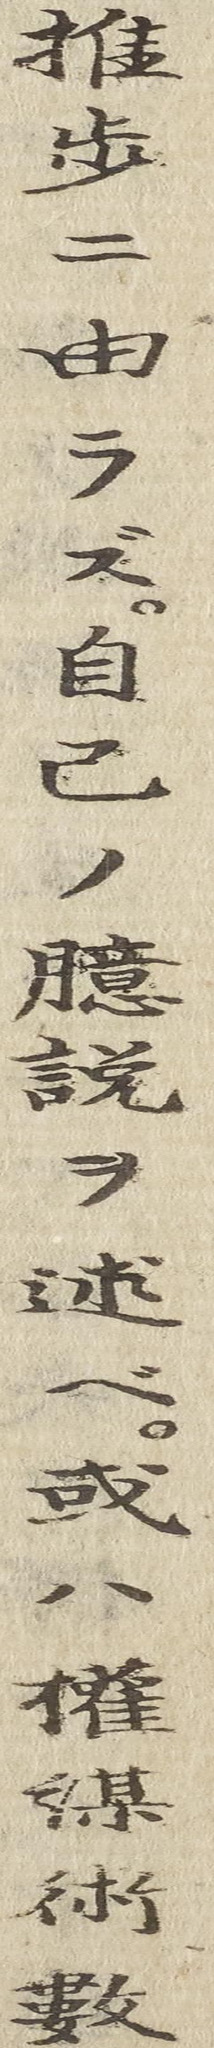推歩ニ由ラズ。自己ノ臆説ヲ述ベ。或ハ権謀術数
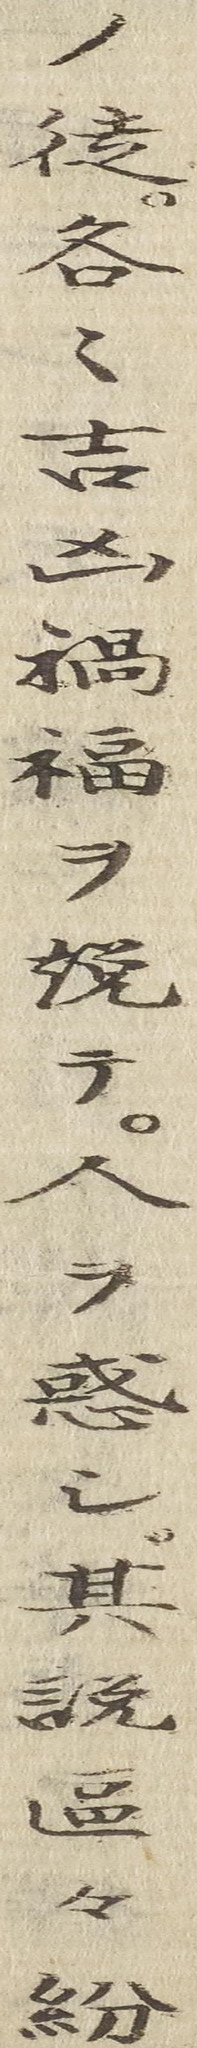ノ徒。各々吉凶禍福ヲ説テ。人ヲ惑シ。其説区々紛
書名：大略天学名目鈔　天經或問附録
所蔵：東京大学地震研究所図書室 Earthquake Research Institute Library, The University of Tokyo, JAPAN
